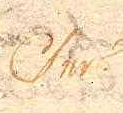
Iur.o
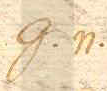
g. n.
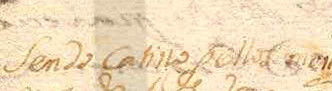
sendo catiuo pellos mou
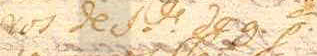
ros de I.de de 9. pa.
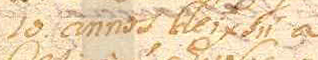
10 annos deixou a
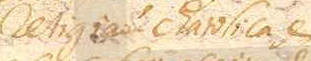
Religiaõ chatolica, e
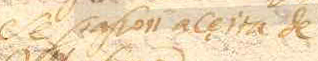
se passou a ceita de
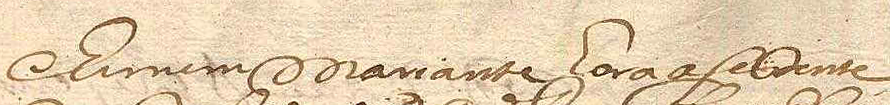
e homem mariante hora asistente
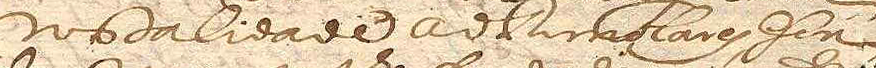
nesta cidade ao Remolares, e sen
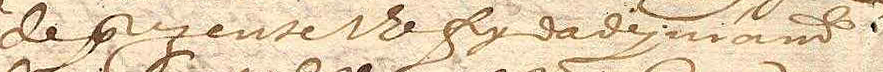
do prezente lhe foy dado juramto
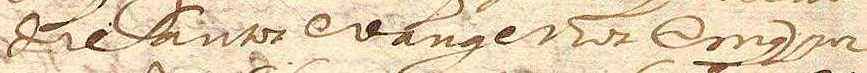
dos Santos evangelhos Em q̄ pos
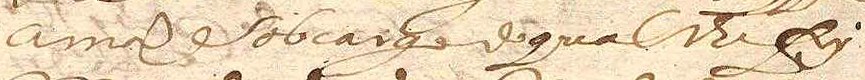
a maõ Sob cargo do qual lhe foy
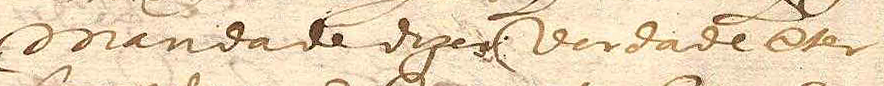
mandado dizer verdade e ter
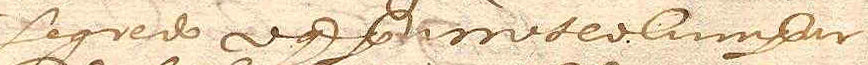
segredo o q̄ prometeo cumprir
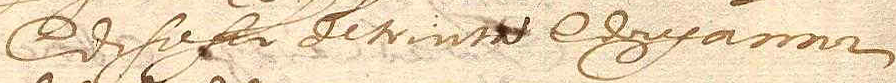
E disse ser de trinta e dous annos
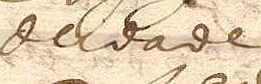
de idade
